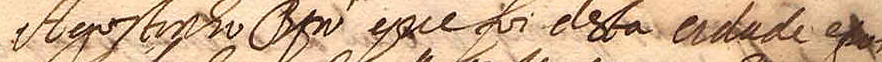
Agostinho Bpō que foi desta cidade e por
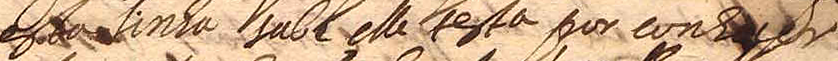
esta linha sabe elle testa por conhecer
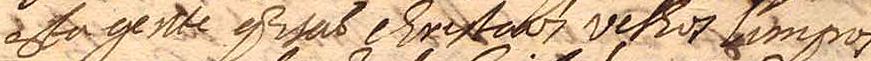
esta gente q̄ saõ christaõs velhos limpos
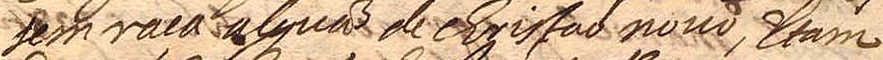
sem raça alguā de christaõ nouo, E tam
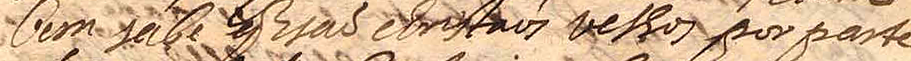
bem sabe q̄ saõ christaõs velhos por parte
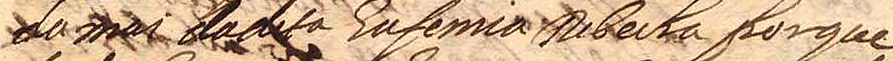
da mai da dita Eufemia Ribeira porque
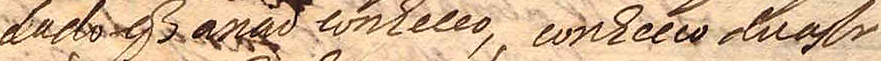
dado q̄ a naõ conheceo, conheceo duas Ir
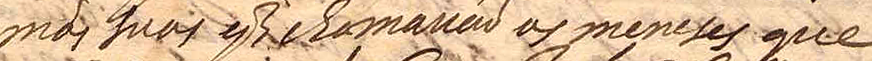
mās suas q̄ chamauaõ as meneses que
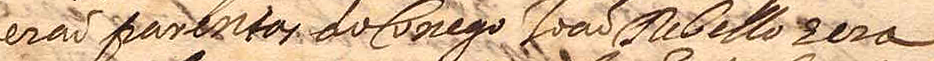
eraõ parentas do Conego Joaõ Rebello E era
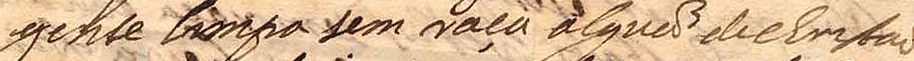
gente limpa sem raça alguā de christaõ
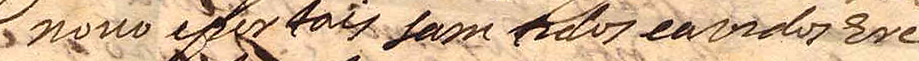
nouo e per tais sam tidos e auidos E re
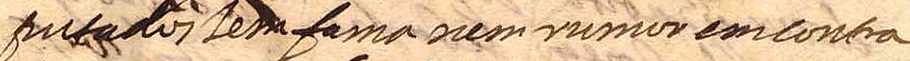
putados sem fama nem rumor em contra
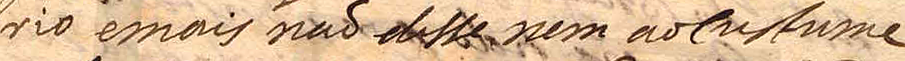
rio e mais naõ disse nem ao custume
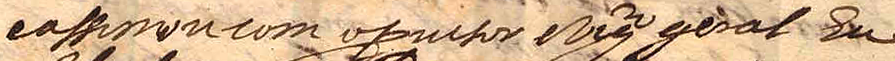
e assinou com o ꝓuisor e vigro geral Eu
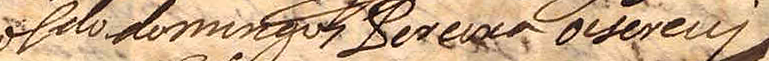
o Ldo. domingos Pereira o escreuj
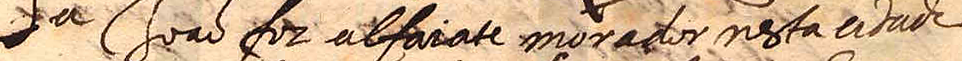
Ta. Joaõ frz alfaiate morador nesta cidade
